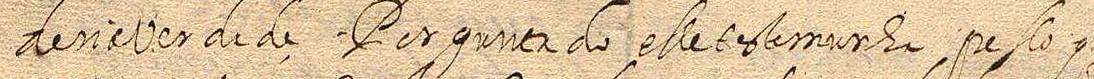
desia verdade, Perguntado elle testemunha pello q̄
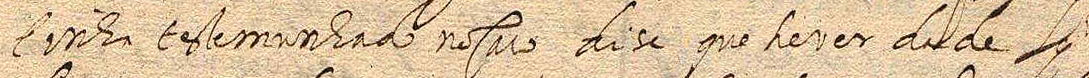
tinha testemunhado no Caso dise que he verdade q̄
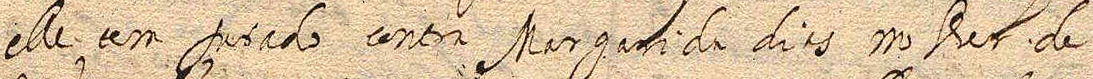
elle tem jurado contra Margarida dias molher de
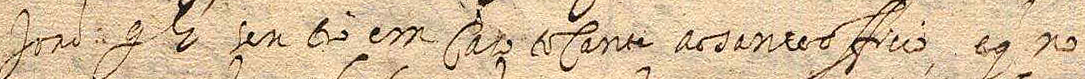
Joaõ glz̄ seu tio em Caso toCante ao sancto officio, e q̄ no
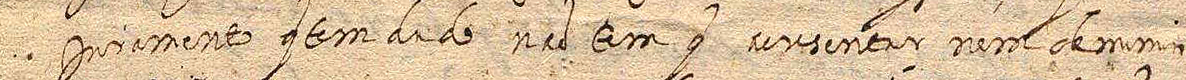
juramento q̄ tem dado naõ tem q̄ acresentar, nem deminuir
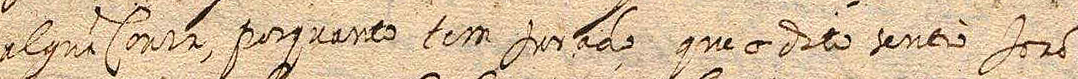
alguā Couza, porquanto tem jurado que o dito seu tio Joaõ
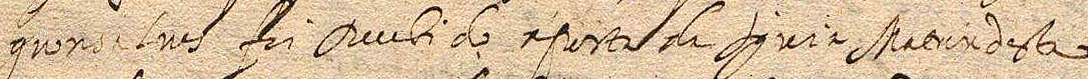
guonsalues foi Recebido a porta da Jgreia Matrix desta
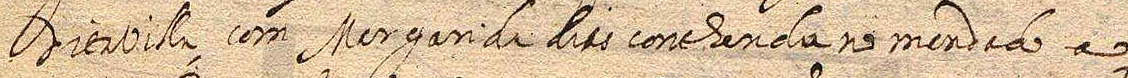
dita villa, com Margarida dias contheuda no mandado a
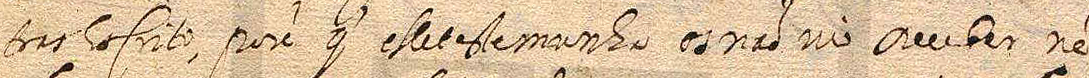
tras EsCrito, porē q̄ elle testemunha os naõ uio Receber nē
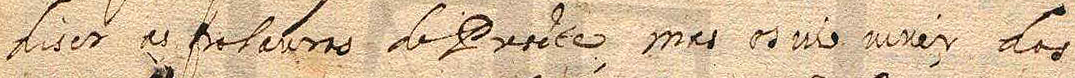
diser as palauras de Presēte, mas os uio uiuer das
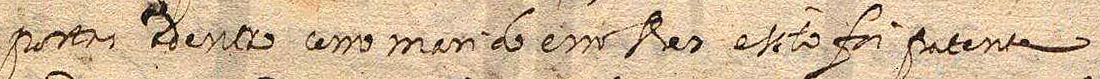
portas adentro como marido e molher e isto foi patente
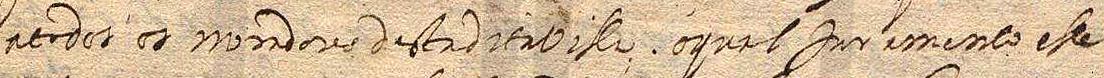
a todos os moradores desta dita villa. o qual Juramento elle
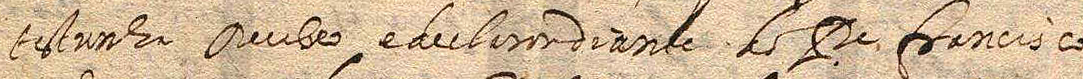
testunha Recebeo e declarou diante do P.e francisco
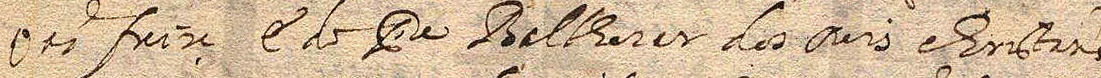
vaz̄ freire & do Pe Balthezer dos Reis christañs
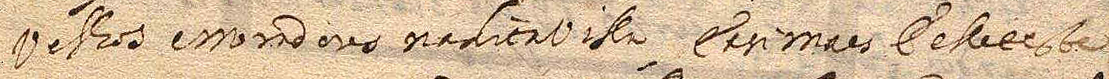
velhos e moradores na dita villa, & asi maes & elle teste
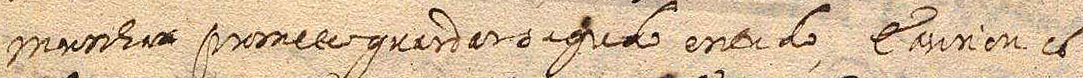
munha prometeo guardar segredo en tudo, & asinou cō
